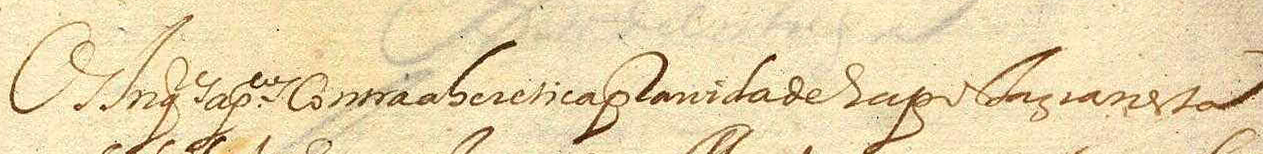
Os Inqres ap.cos contra a heretica pravidade E apostazia nesta
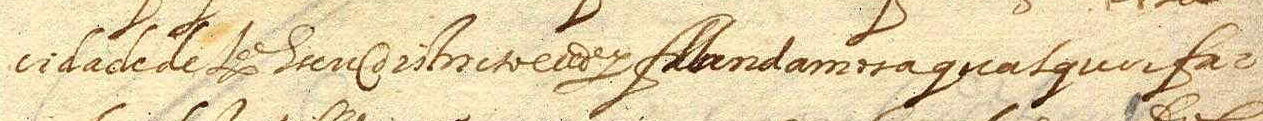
cidade de Lxa E seu districto etttꝭa Mandamos a qualquer fa
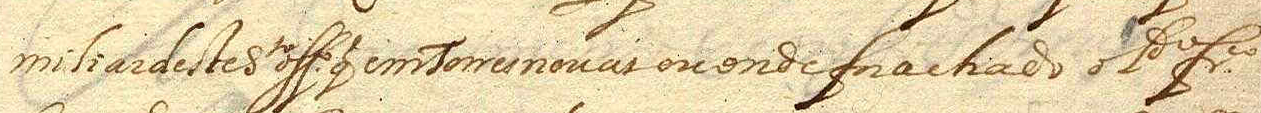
miliar deste sto offo q̄ em Torres nouas ou onde for achado o ldo fr.co
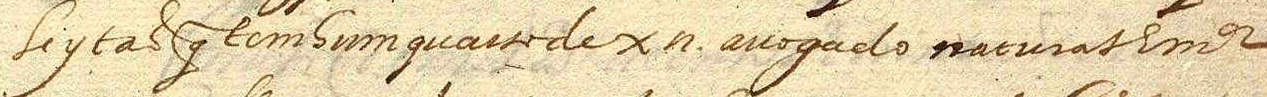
Leytaõ q̄ tem hum quarto de x n. auogado natural E mor
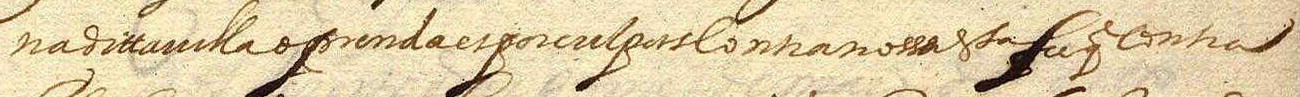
na ditta uilla o prendaes por culpas contra nossa sta fee q̄ contra
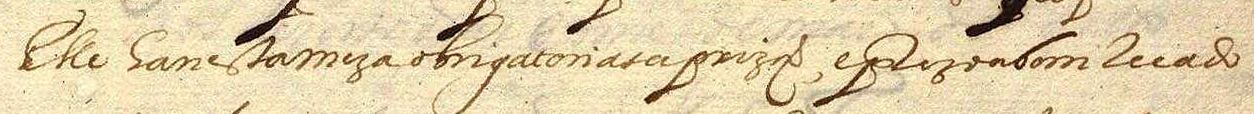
Elle ha nesta meza obrigatorias a prizaõ, e prezo a bom Recado
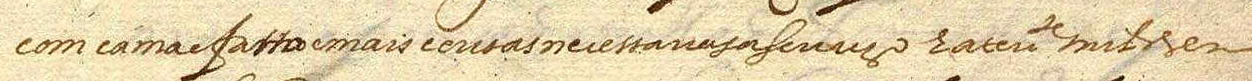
com cama e fatto e mais cousas necessarias a seu uzo E ate ute mil rs em
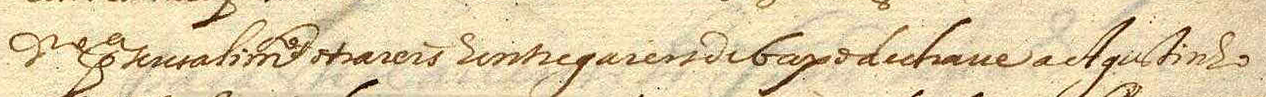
dro pa seus alimtos o trareis E entregareis debaxo de chaue a Agustinho
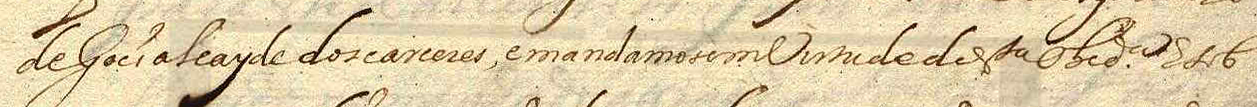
de Goēs alcayde dos carceres, e mandamos em Virtude de sta obed.a E sob
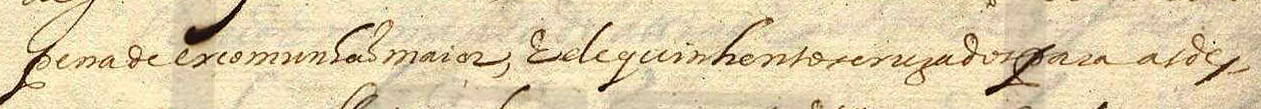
pena de excomunhaõ maior, E de quinhentos cruzados para as des
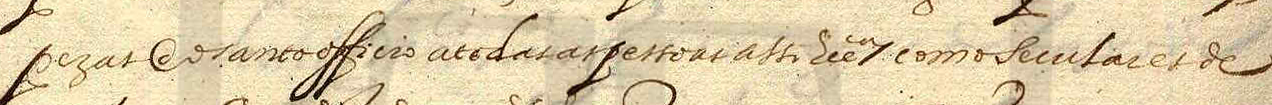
pezas do santo officio a todas as pessoas assi Eccas como seculares de
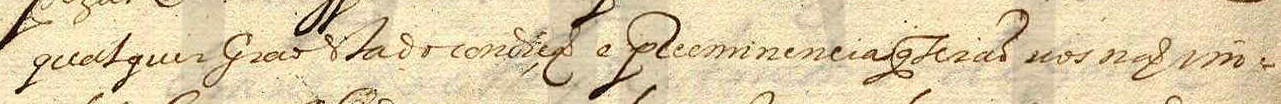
qualquer Grao estado condiçaõ e preeminencia q̄ seiaõ uos naõ im
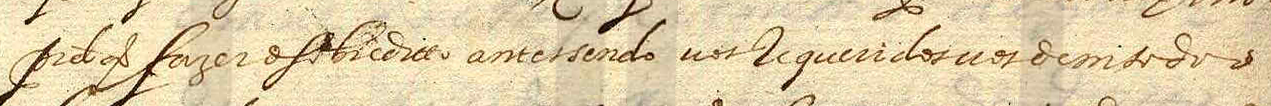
pidaõ fazer o sobreditto antes sendo uos Requeridos uos dem todo o
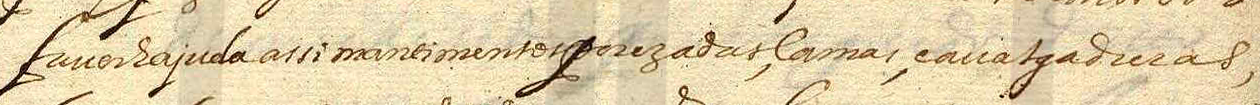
fauor E ajuda assi mantimentos pouzadas, camas, caualgaduras,
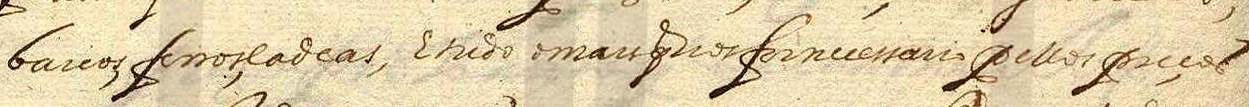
barcos, ferros, cadeas, E tudo o mais q̄ uos for necessario pellos preços
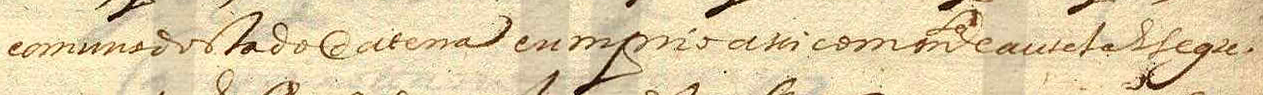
comuns do stado da terra cumprio assi com mta cautela E segre
